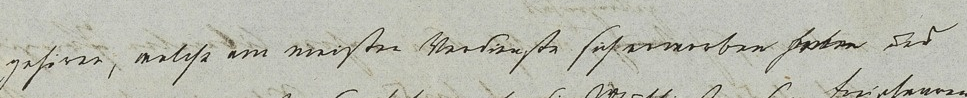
gehören, welche am meisten Verdienste sich erworben haben und
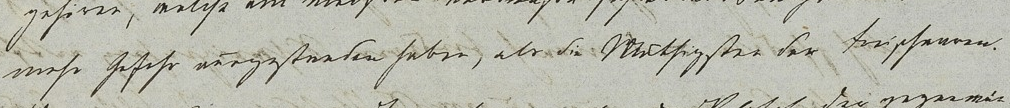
mehr Gefahr ausgestanden haben, als die Muthigsten der Freischaaren.
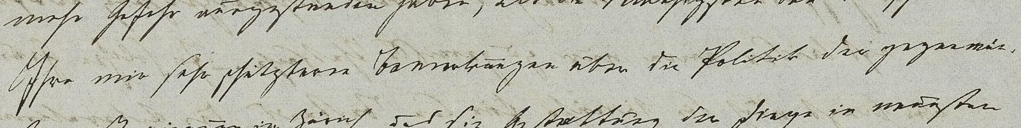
Ihre mir sehr schätzbaren Bemerkungen über die Politik der gegenwär-
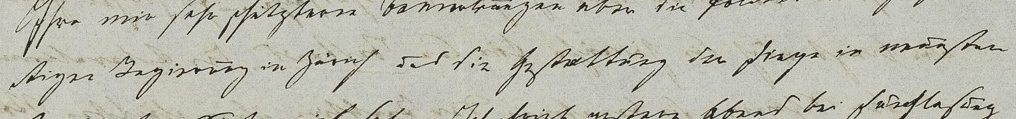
tigen Regierung in Zürich und die Gestaltung der Dinge in neuester
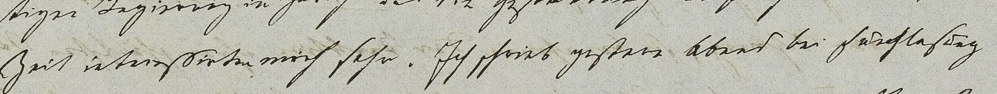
Zeit interessirten mich sehr. Ich schrieb gestern Abend bei Durchlesung
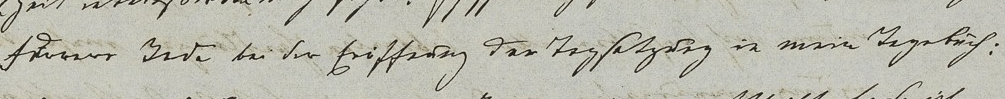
Furrers Rede bei der Eröffnung der Tagsatzung in mein Tagebuch:
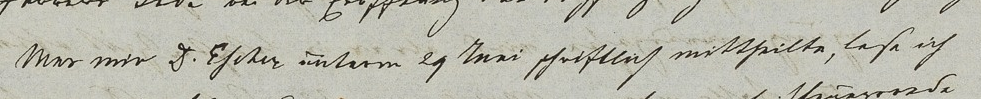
«Was mir Dr. Escher unterm 29 Juni schriftlich mittheilte, lese ich
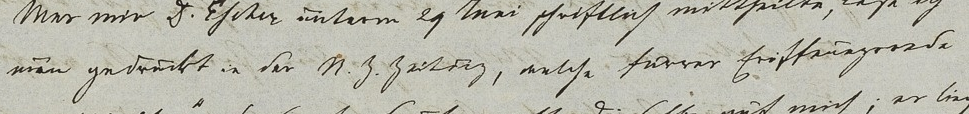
nun gedruckt in der N. Z. Zeitung, welche Furres Eröffnungsrede
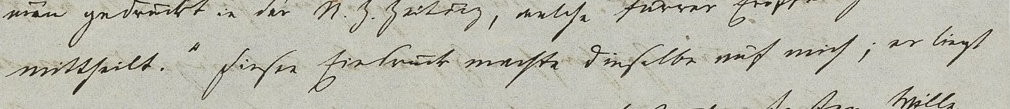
mittheilt.» Diesen Eindruck machte dieselbe auf mich; es liegt
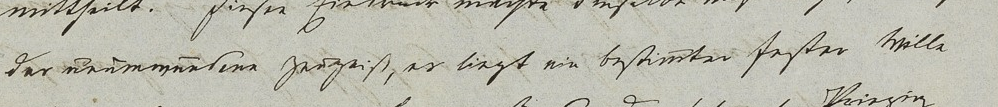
das unumwundene Zeugniß, es liegt ein bestimmter fester Wille
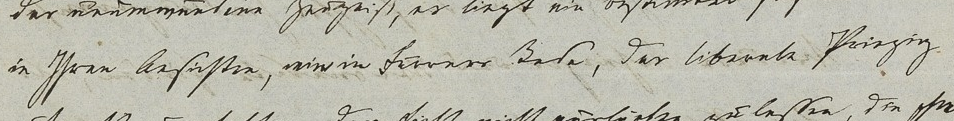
in Ihren Ansichten, wie in Furrers Rede, das liberale Prinzip
